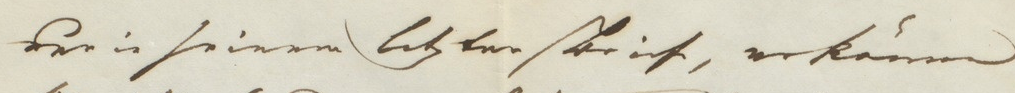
nun in seinem letzten Brief, er könne
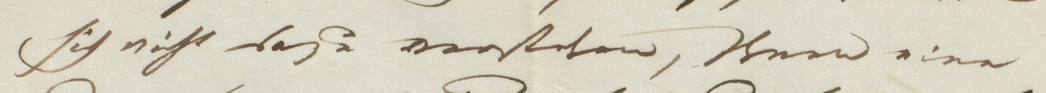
sich nicht dazu verstehen, Ihnen eine
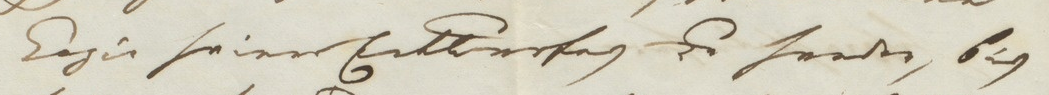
Copie seines Entwurfes zu senden, bis
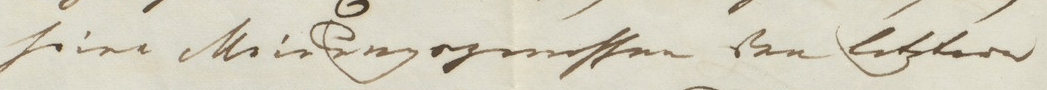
seine Meinungsgenossen den letztern
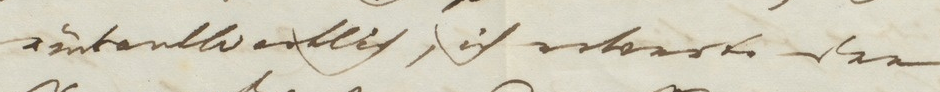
rückantwortlich, ich erwarte den
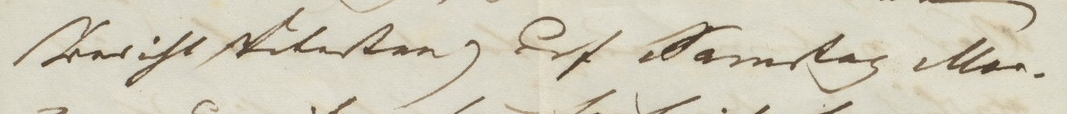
Bericht spätestens auf Samstag Mor-
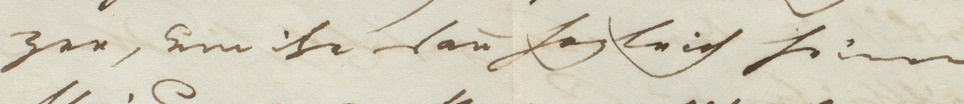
gen, um ihn dann sogleich seinen
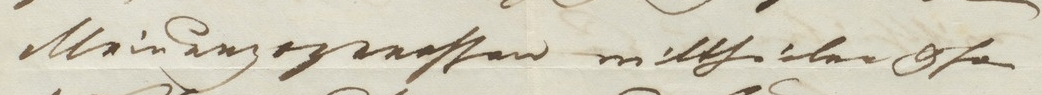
Meinungsgenossen mittheilen & so-
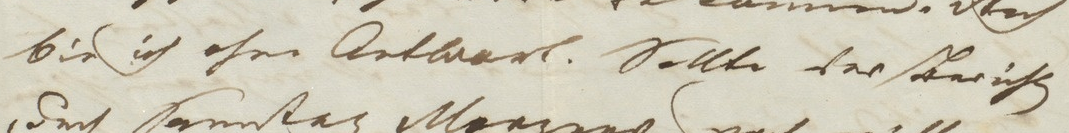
bin ich ohne Antwort. Sollte der Bericht
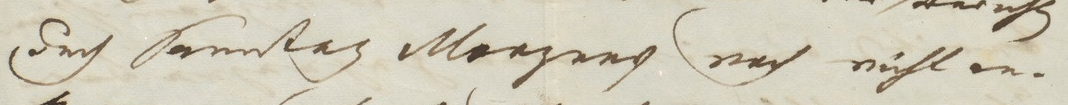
auch Samstag Morgens noch nicht an-
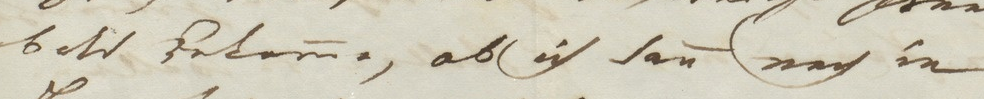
bald zukomme, ob ich dann noch in
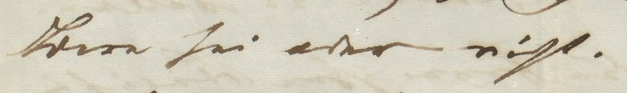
Bern sei oder nicht.
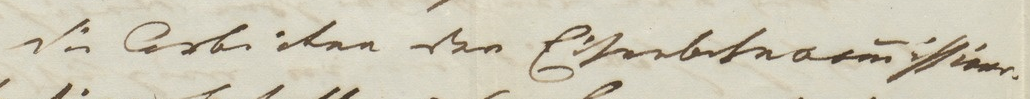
Die Arbeiten der Eisenbahncommissions-
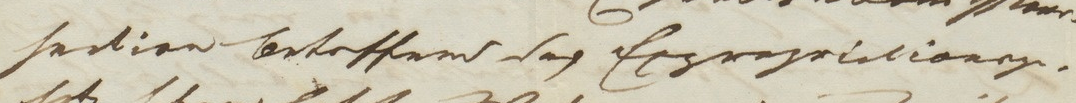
section betreffend das Expropriationsge-
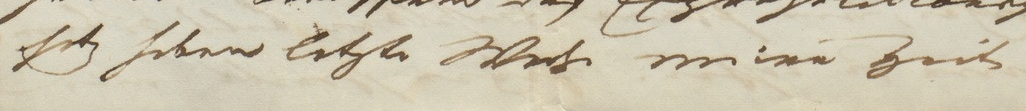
setz haben letzte Woche meine Zeit
